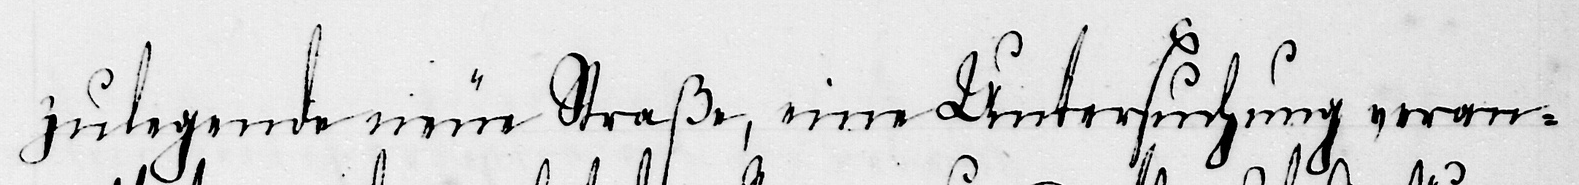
zulegende neue Straße, eine Untersuchung veran¬
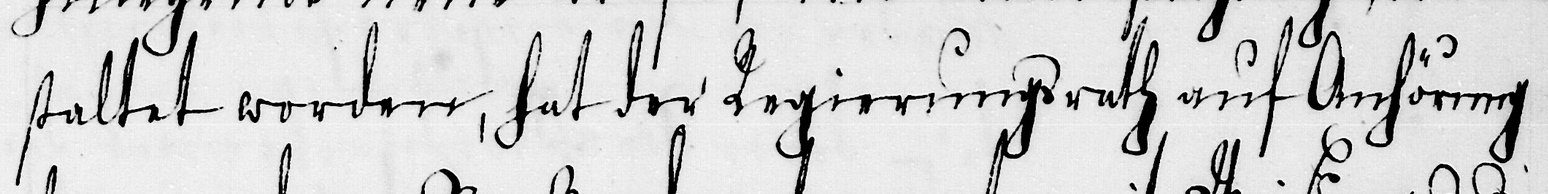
staltet worden, hat der Regierungsrath auf Anhörung
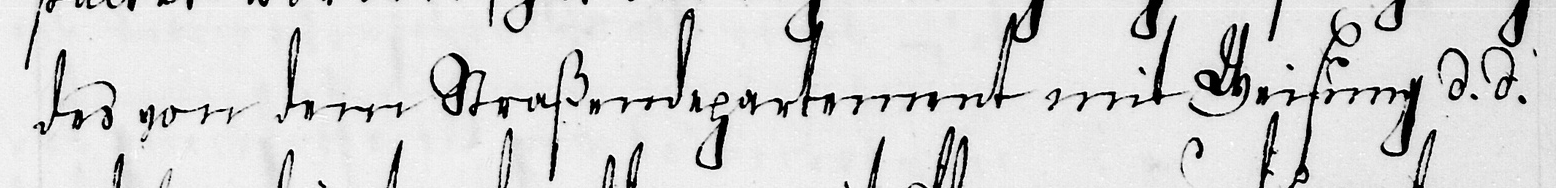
des von dem Straßendepartement mit Weisung d. d.
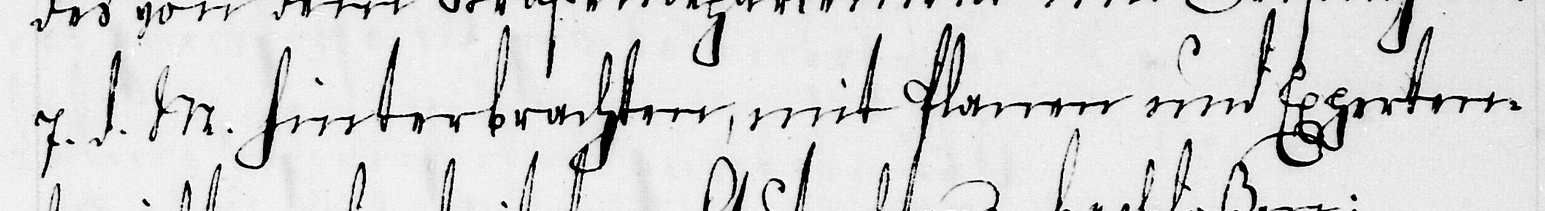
7. d. M. hinterbrachten, mit Planen und Experten¬
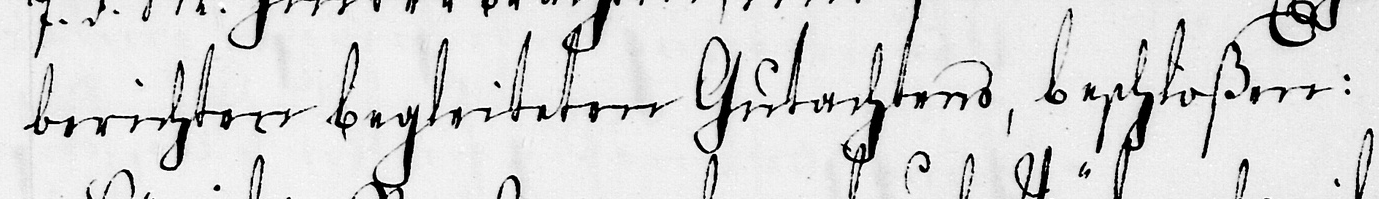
berichten begleiteten Gutachtens, beschloßen:
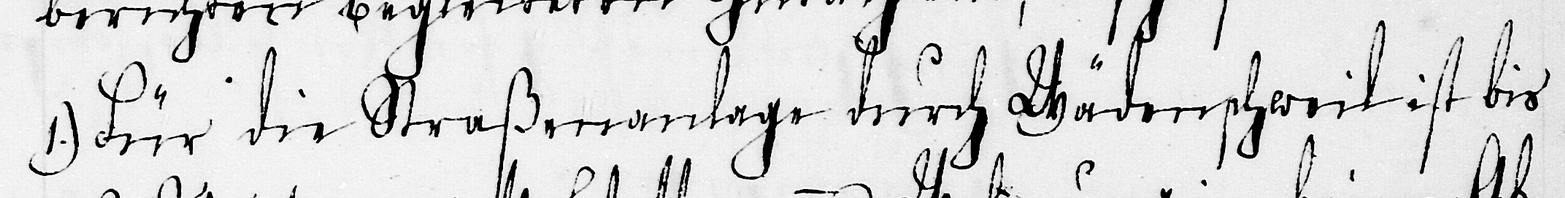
1.) Für die Straßenanlage durch Wädenschweil ist bis
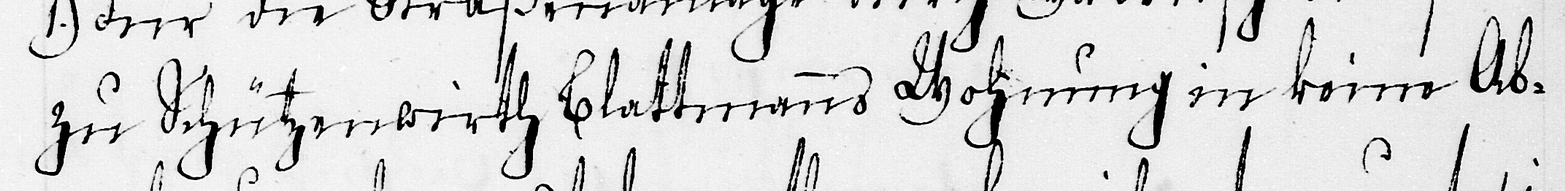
zu Schützenwirth Blattmanns Wohnung in keine Ab¬
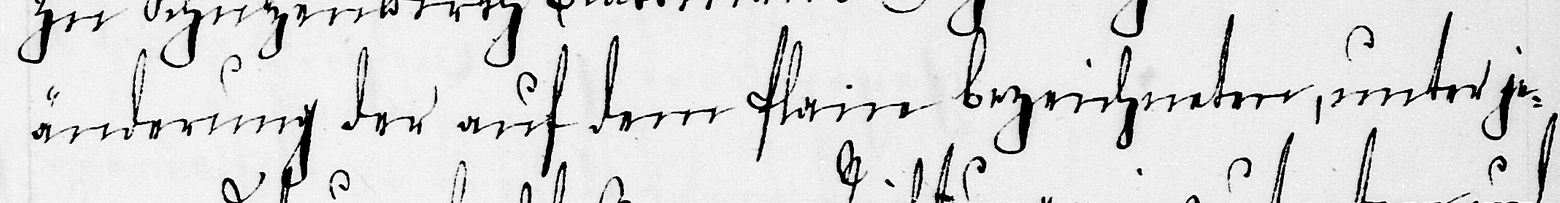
änderung der auf dem Plane bezeichneten, unter je¬
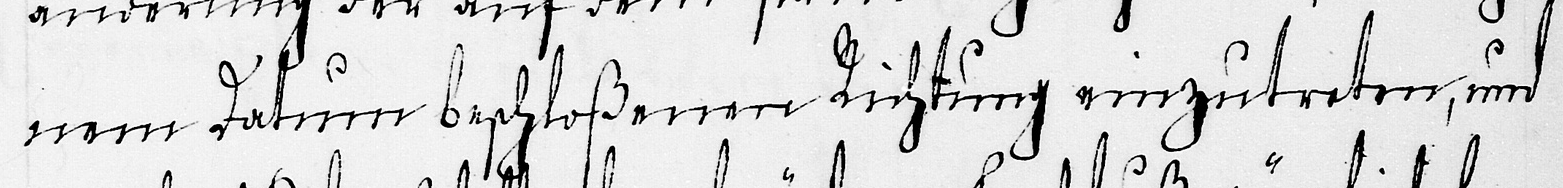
nem Datum beschloßenen Richtung einzutreten, und
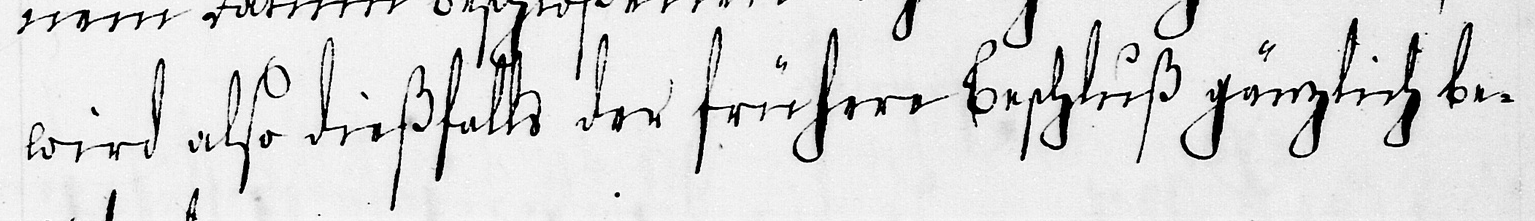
wird also dießfalls der frühere Beschluß gänzlich be¬
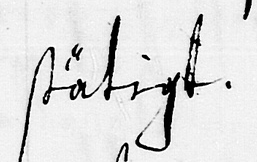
stätigt.
